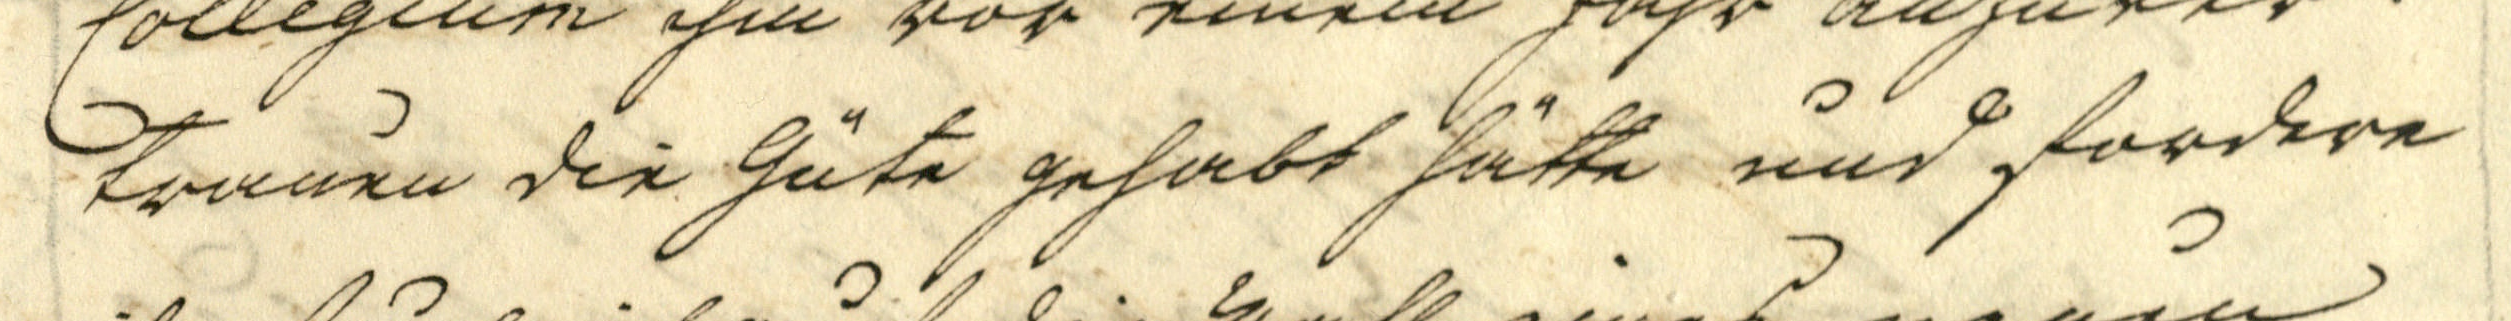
trauen die Güte gehabt hätte und fordere
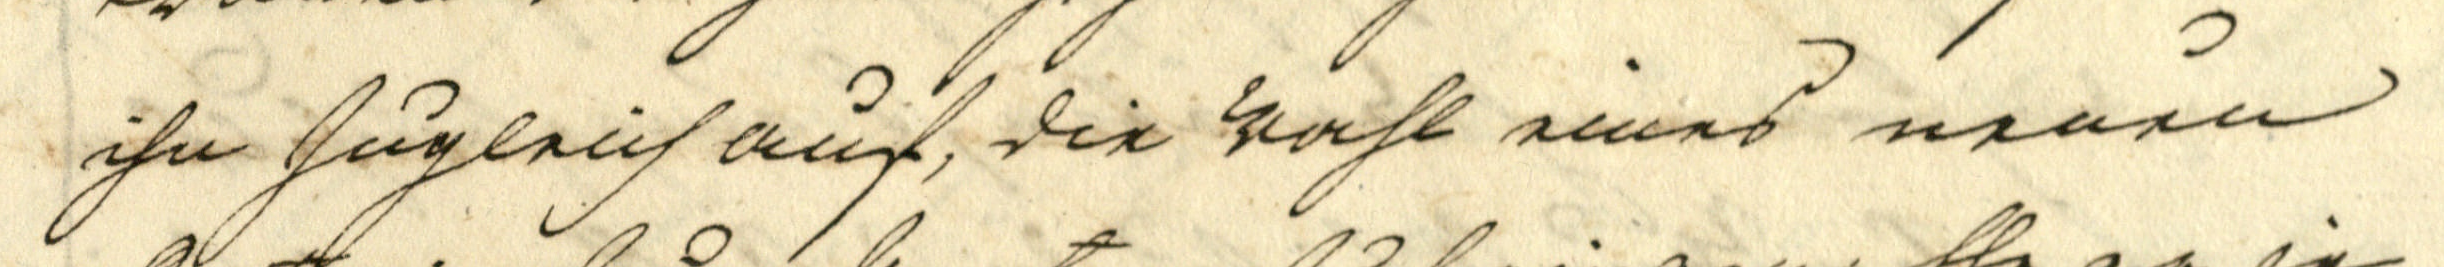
ihn zugleich auf, die Wahl eines neuen
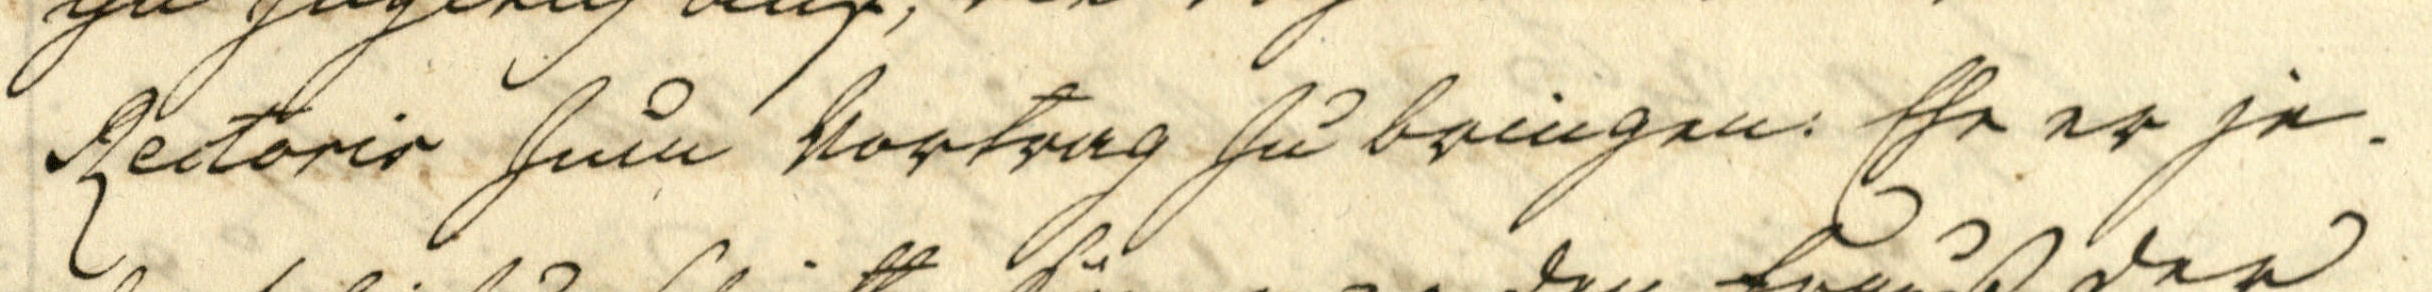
Rectoris zum Vortrag zu bringen. Ehe er je¬
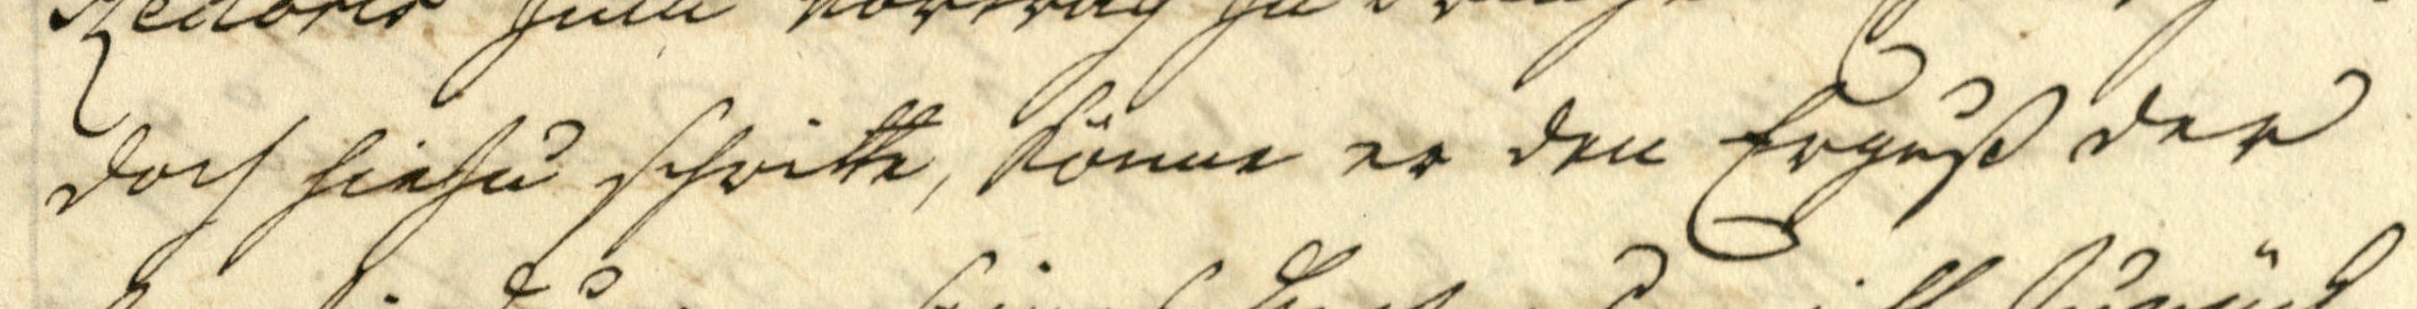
doch hiezu schritte, könne er den Erguß der
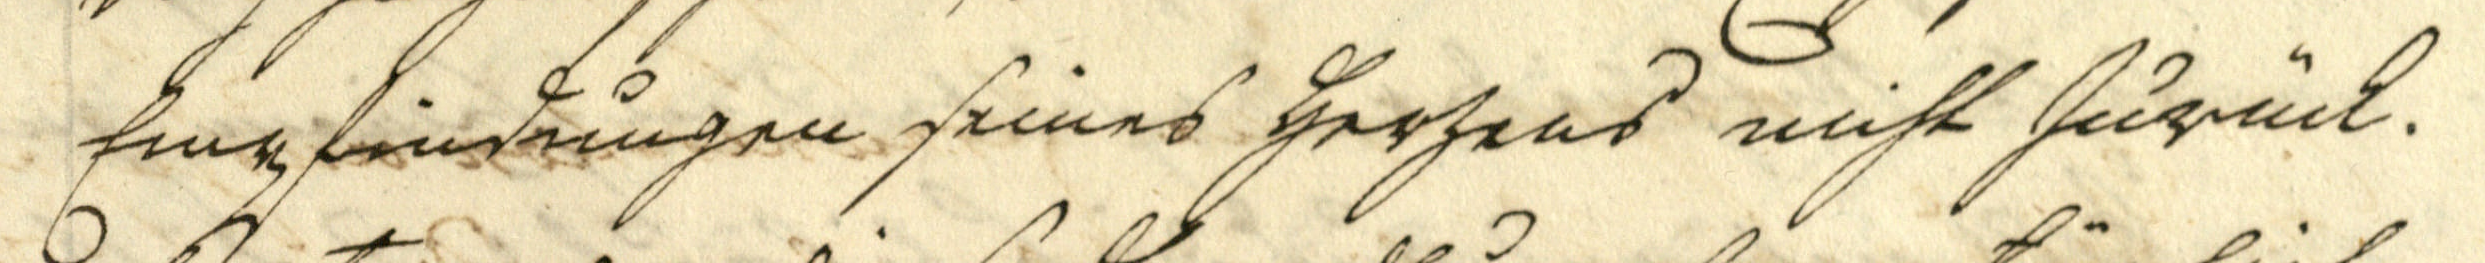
Empfindungen seines Herzens nicht zurück¬
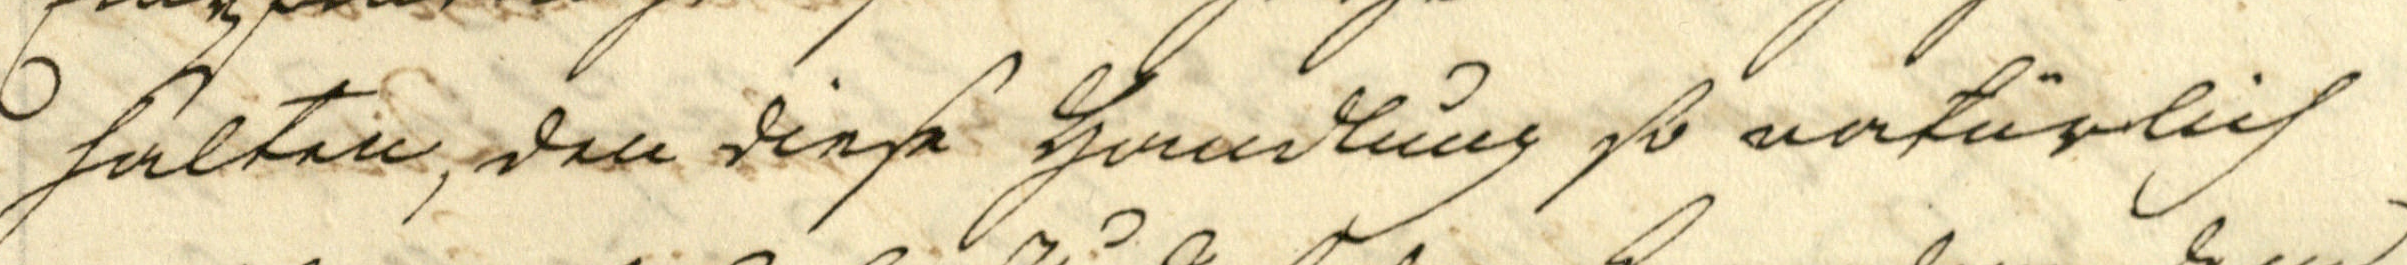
halten, den diese Handlung so natürlich
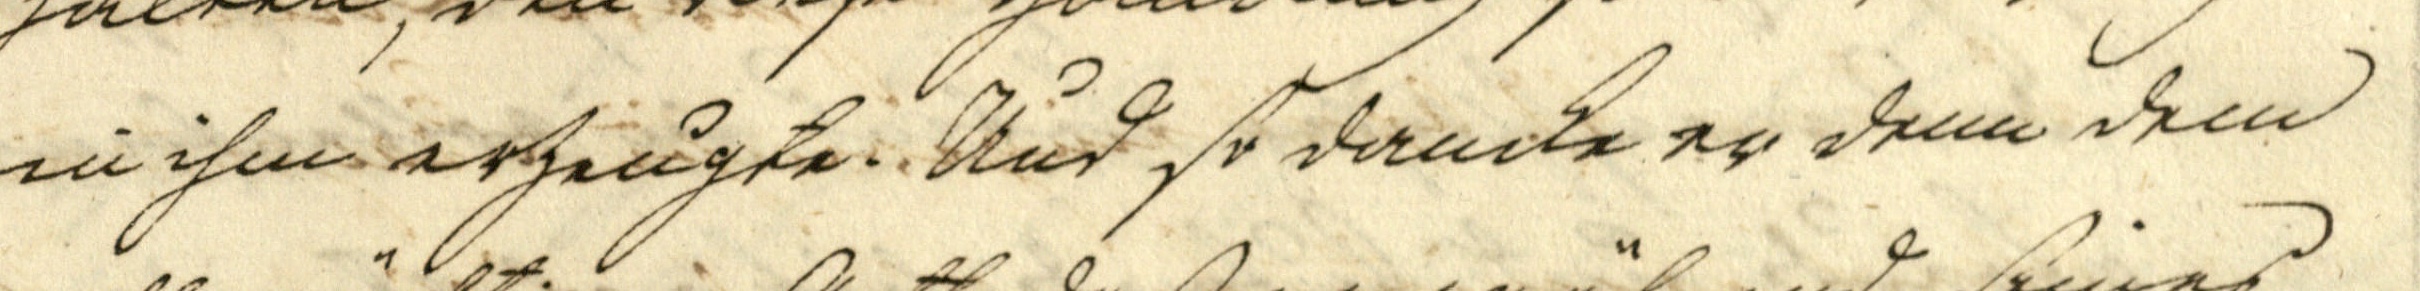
in ihm erzeugte. Und so dancke er denn dem
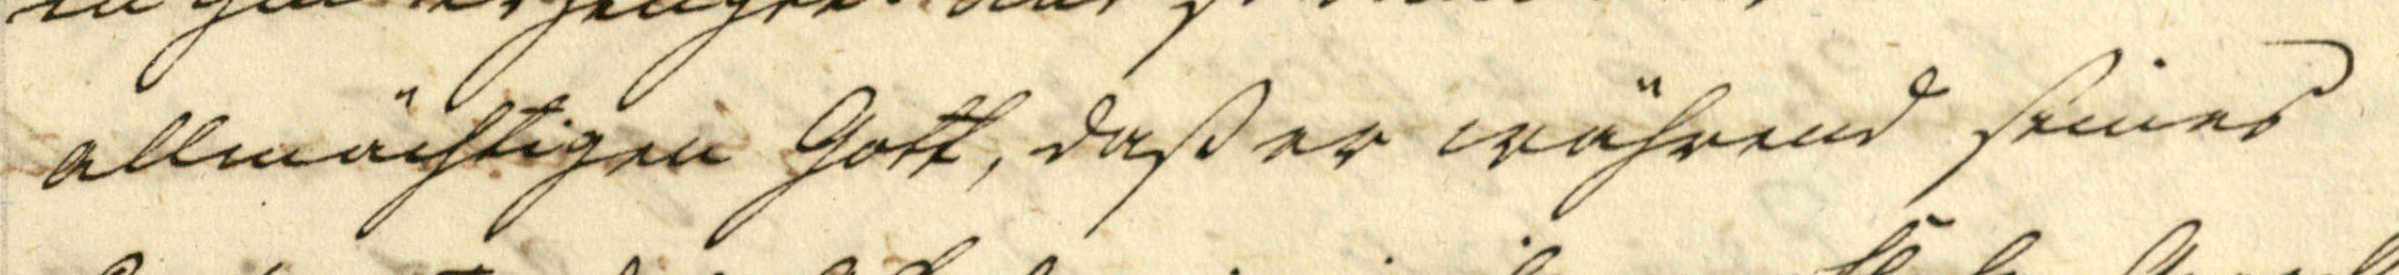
allmächtigen Gott, daß er während seines
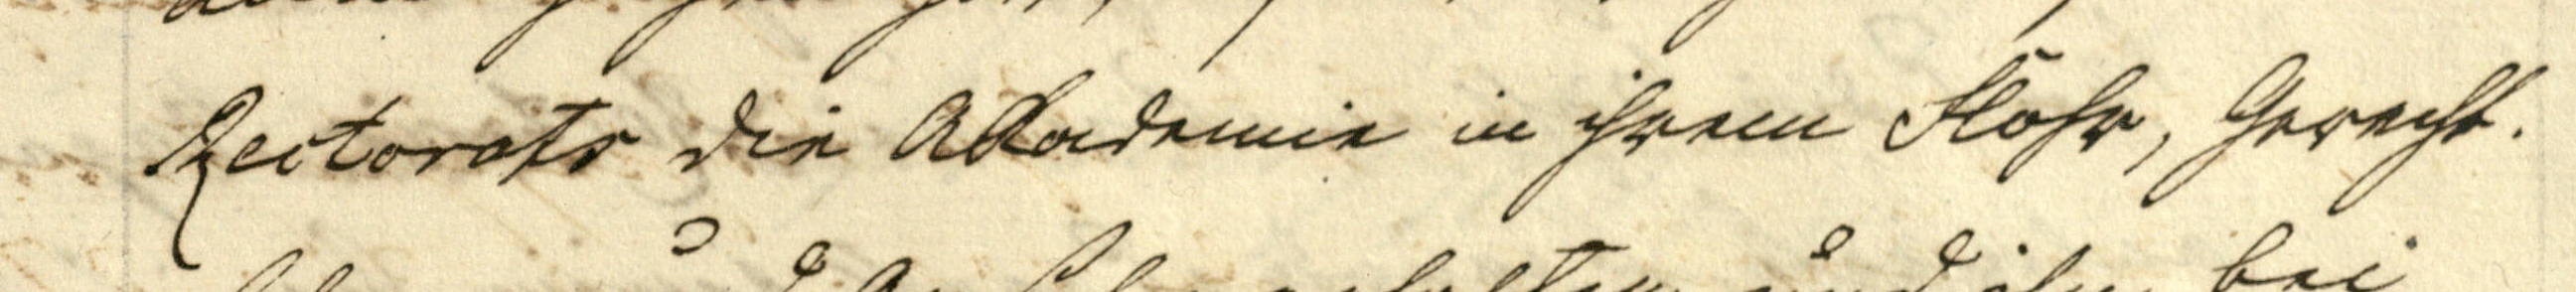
Rectorats die Akademie in ihrem Flohr, Gerecht
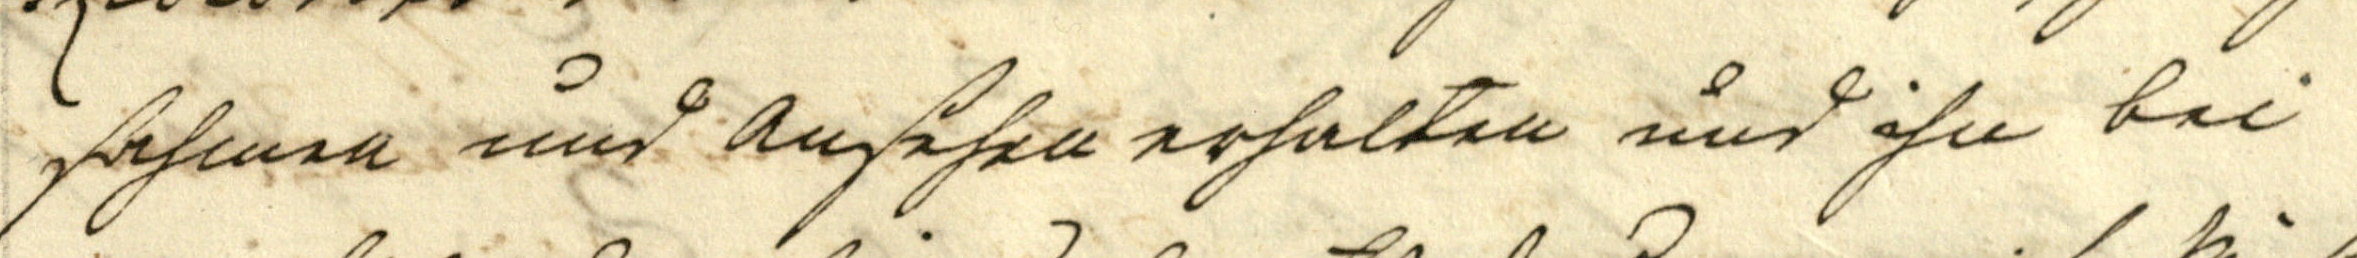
sahmen und Ansehen erhalten und ihn bei
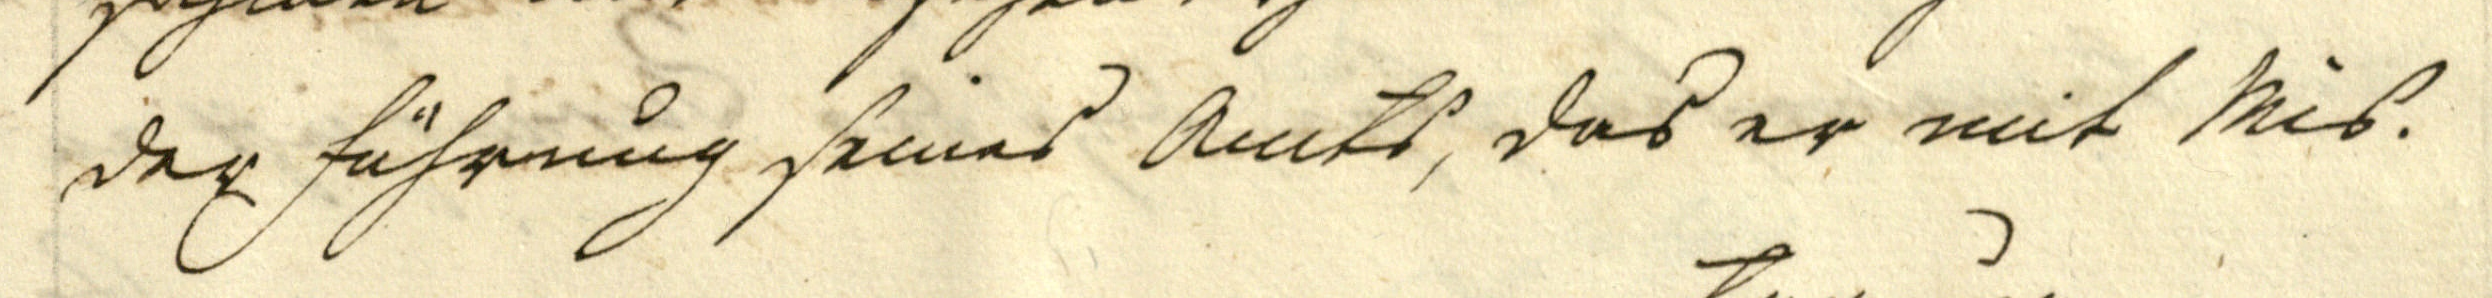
der Führung seines Amts, das er mit Mis¬
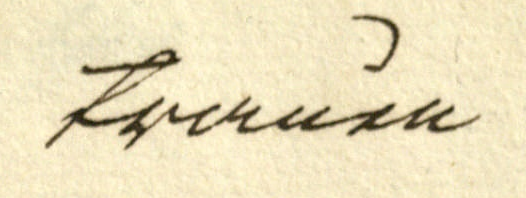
trauen
